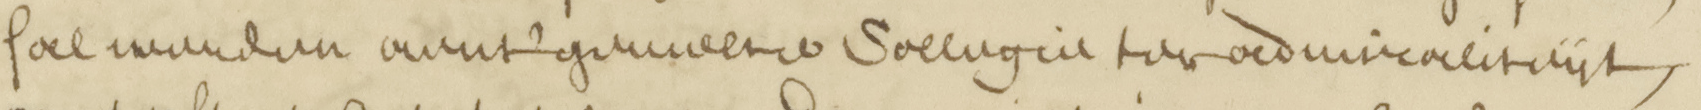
sal werden aent' gemelte Collegie ter admiraliteijt,
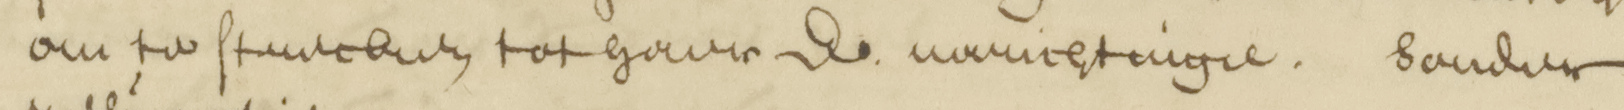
om te strecken tot haer E. narichtinge, sonder
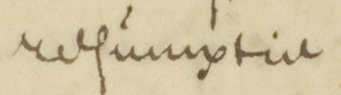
resumptie.
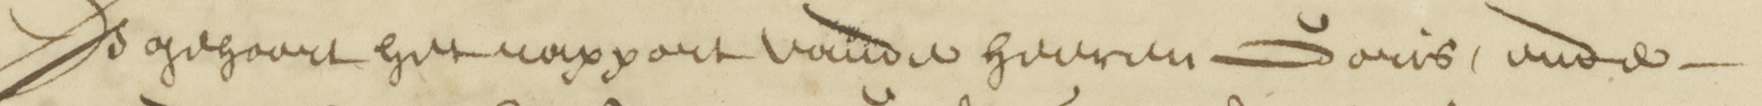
Is gehoort het rapport vande heeren Goris, ende -
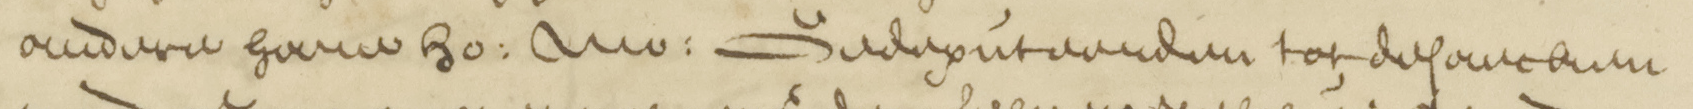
andere hare Ho:Mo: Gedeputeerden tot de saecken
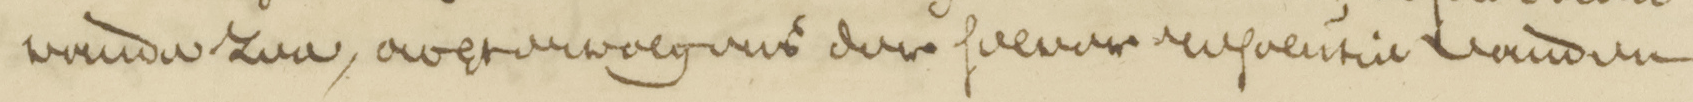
vande Zee, achtervolgens der selver resolutie vanden
